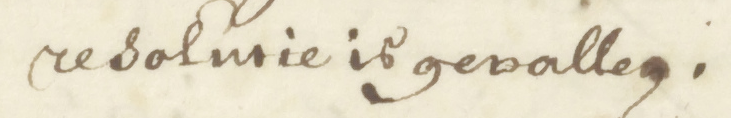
resolutie is gevallen.
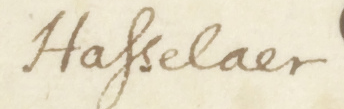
Hasselaer
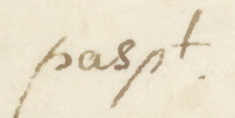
paspt.
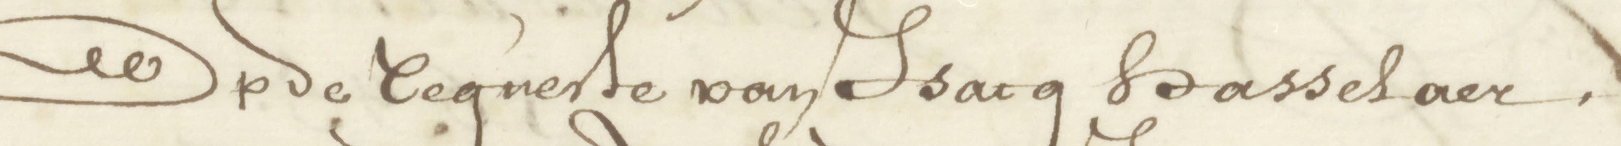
Opde Requeste van Isacq Hasselaer,
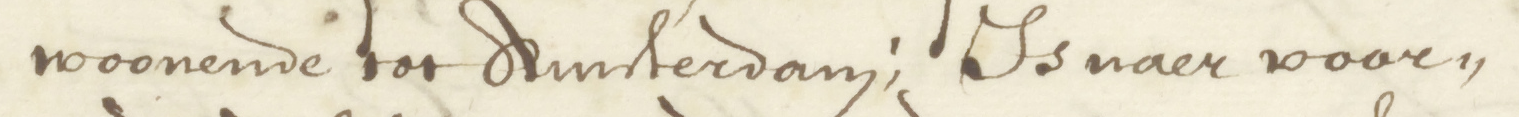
woonende tot Amsterdam; Is naer voor„
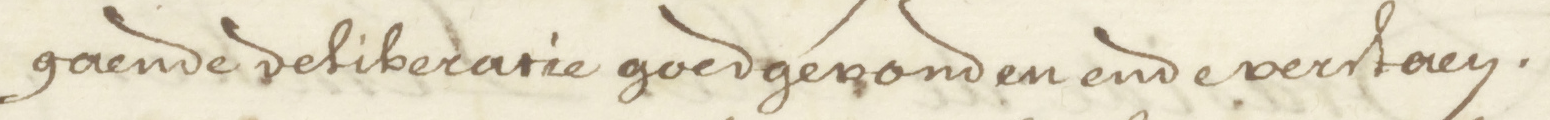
gaende deliberatie goedgevonden ende verstaen,
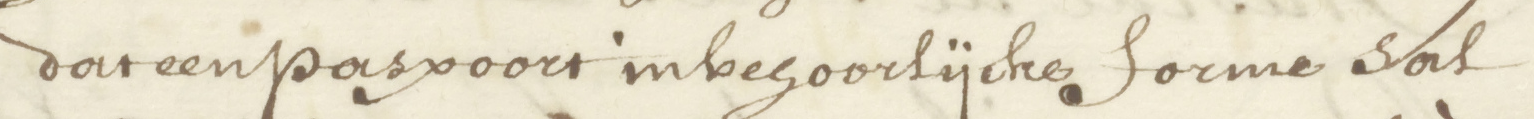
dat een paspoort in behoolijcke forme sal
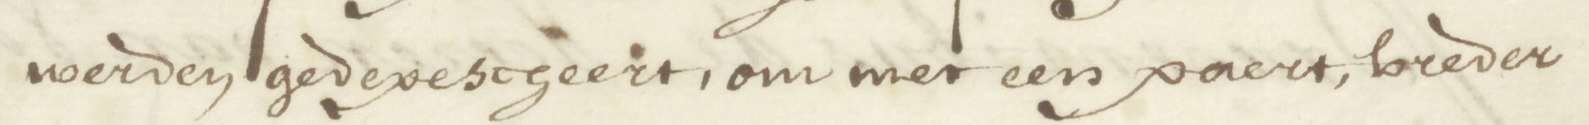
werden gedepescheert, om met een paert, breder
